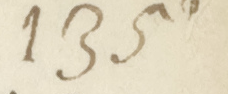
135
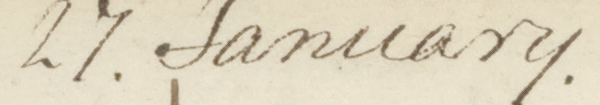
27. January.
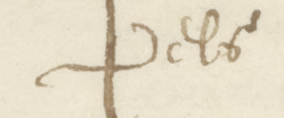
Pels
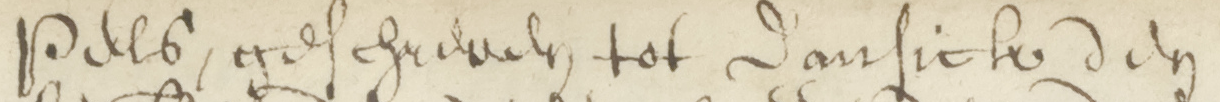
Pels, geschreven tot Dansick den
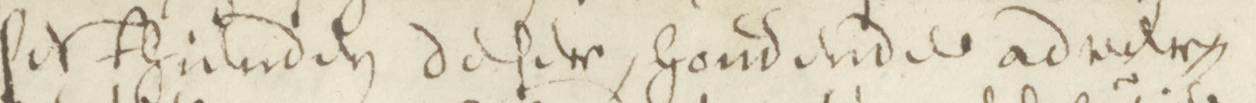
sesthienden deser, houdende adver„
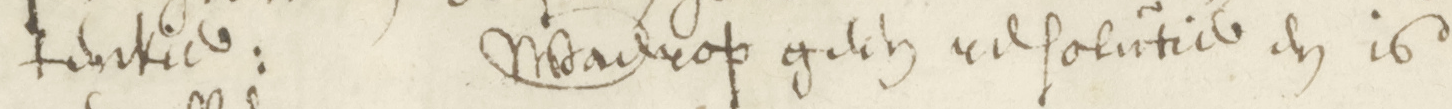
tentie: Waerop geen resolutie en is
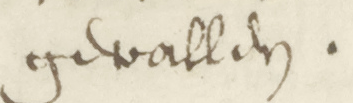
gevallen.
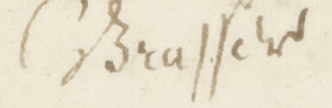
Brasser
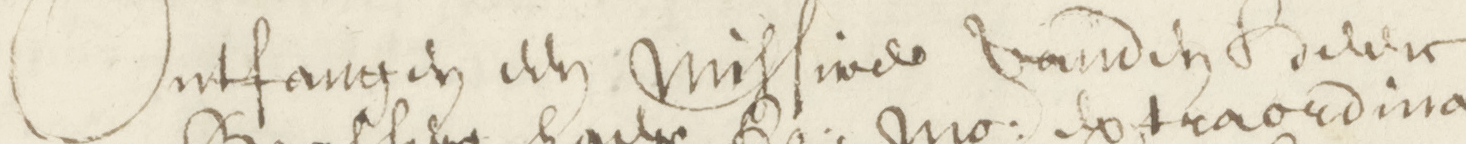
Ontfangen een Missive vanden Heer
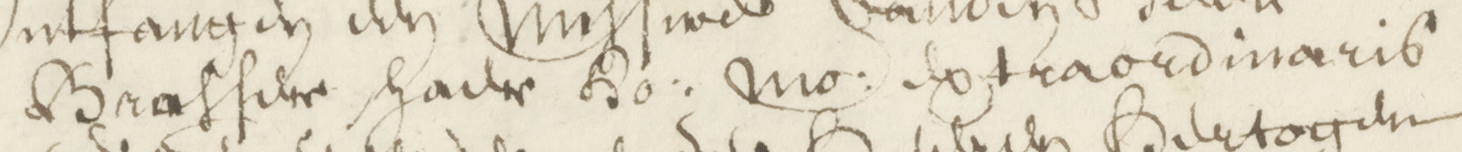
Brasser haer Ho:Mo: extraordinaris
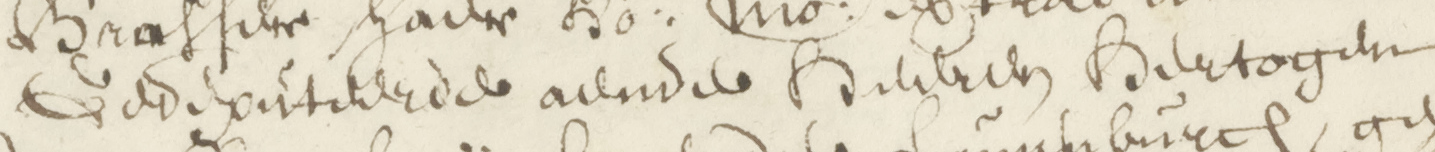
Gedeputeerde aende Heeren Hertogen
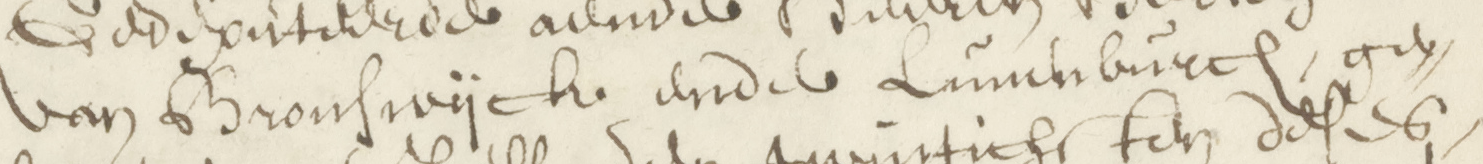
van Bronswijck ende Lunenburch, ge„
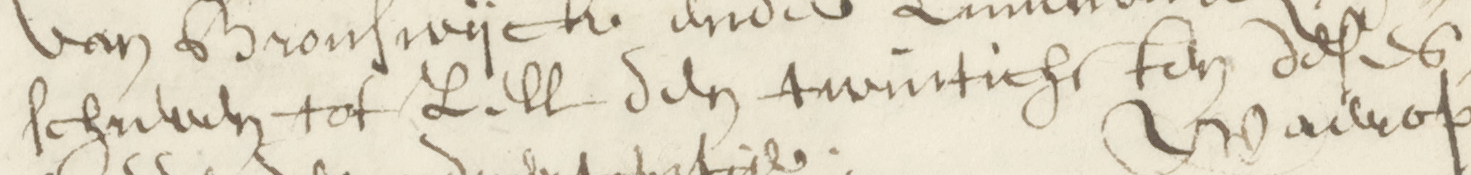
schreven tot Zell den twintichsten deses,
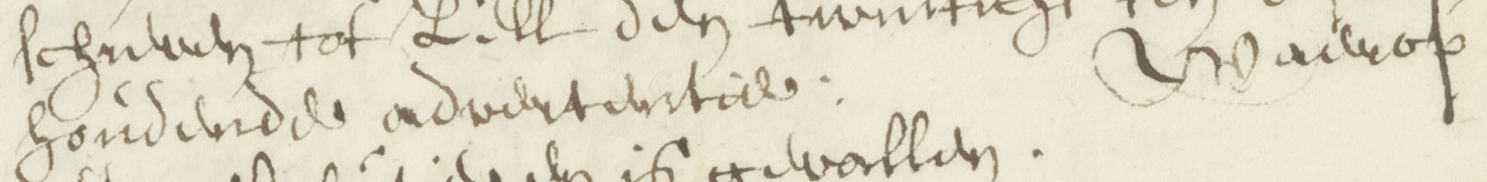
houdende advertentie: Waerop
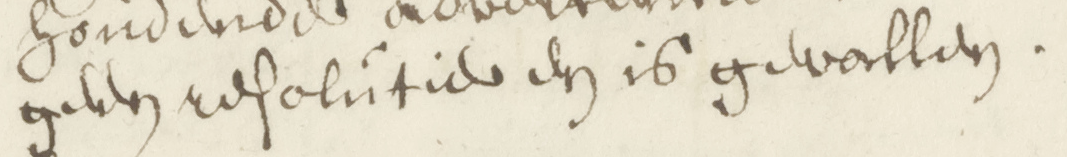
geen resolutie en is gevallen.
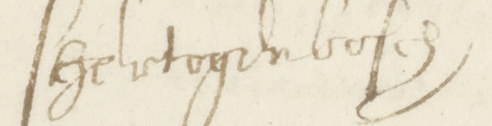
shertogenbosch
